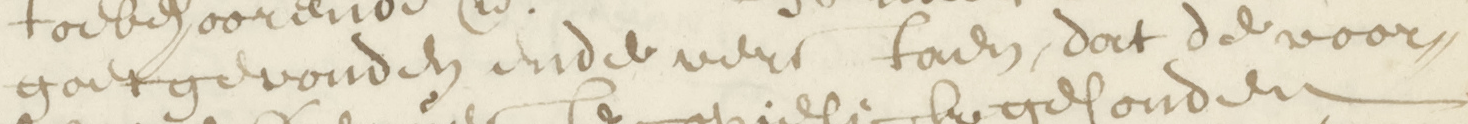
goetgevonden ende verstaen, dat de voor„
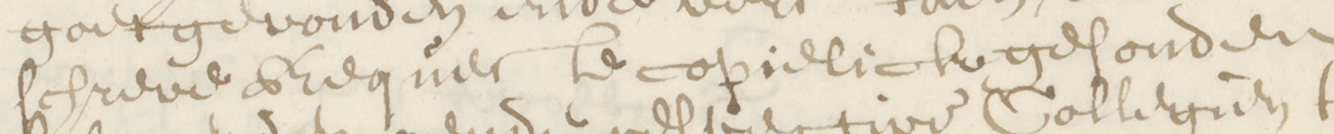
schreve Requeste copielick gesonden
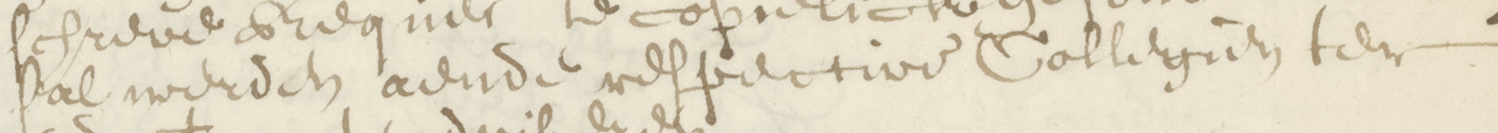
sal werden aende respective Collegien ter
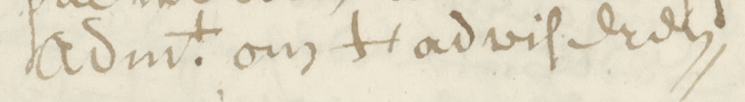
Admt. om t'adviseren.
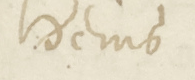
Heins
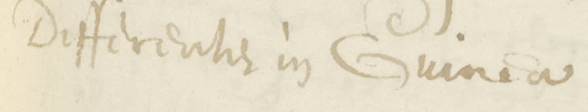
Differenten in Guinea
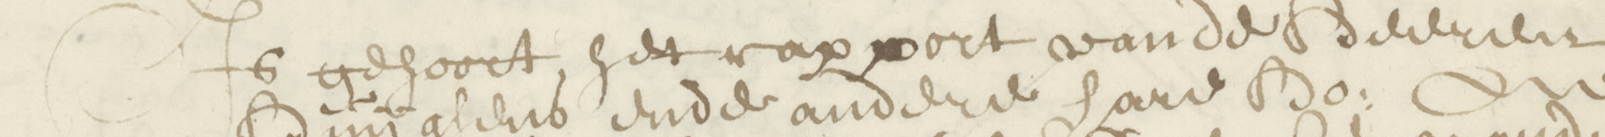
Is gehoort het rapport van de Heeren
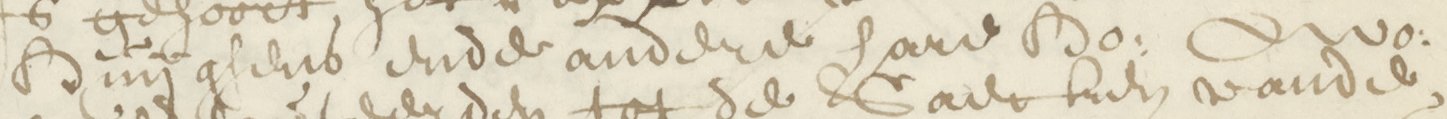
Huijghens ende andere hare Ho:Mo:
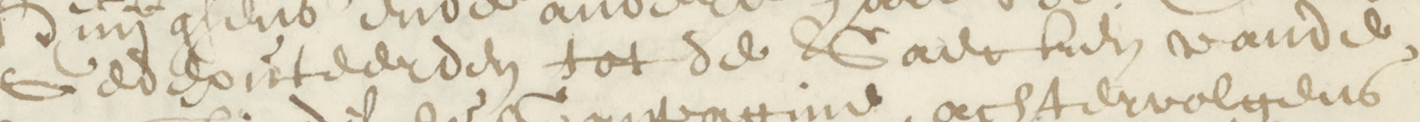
Gedeputeerden tot de Saecken vande
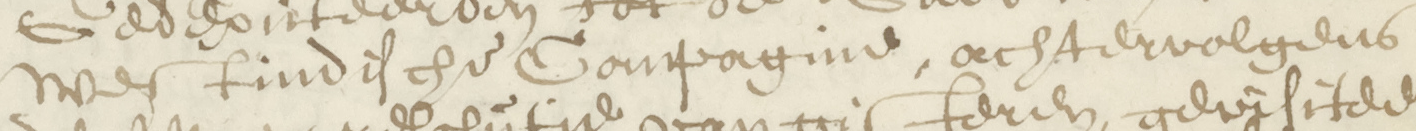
Westindische Compagnie, achtervolgens
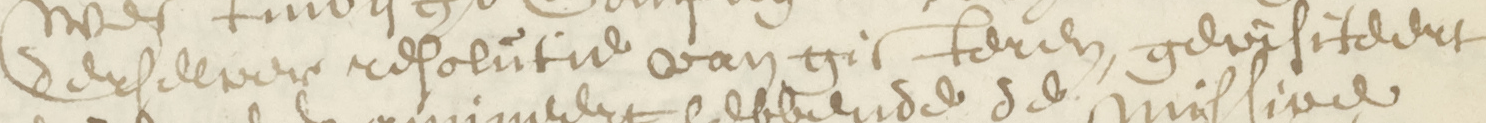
derselver resolutie van gisteren, gevisiteert
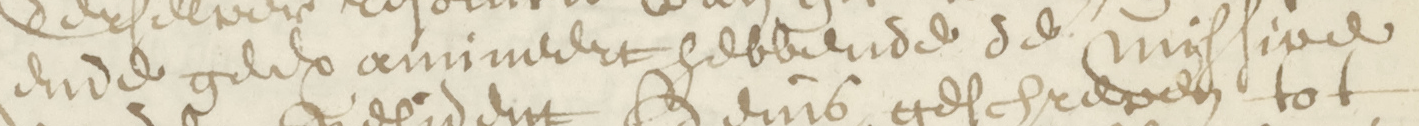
ende geexamineert hebbende de missive
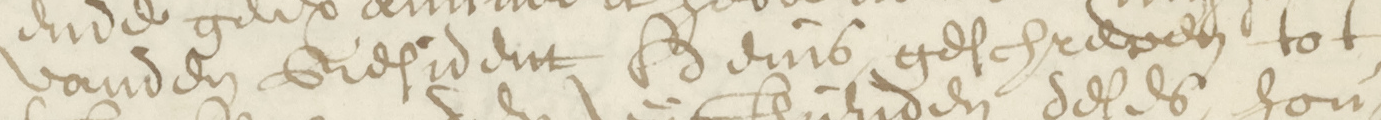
vanden Resident Heins geschreven tot
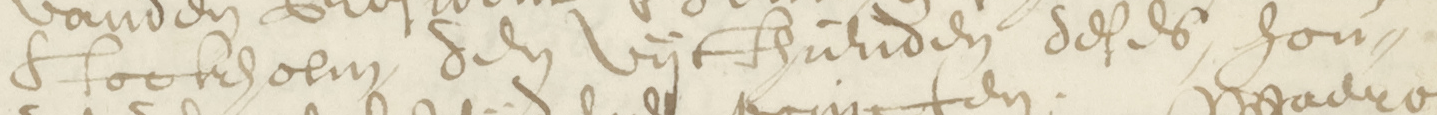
Stockholm, den vijfthienden deses hou„
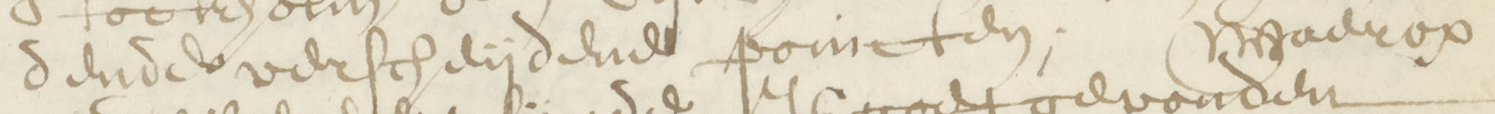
dende verscheijdene poincten; Waerop
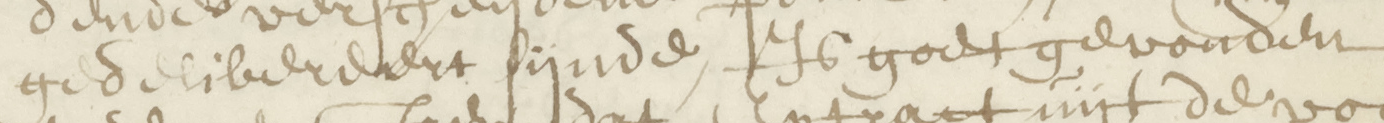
gedelibereert sijnde, Is goetgevonden
